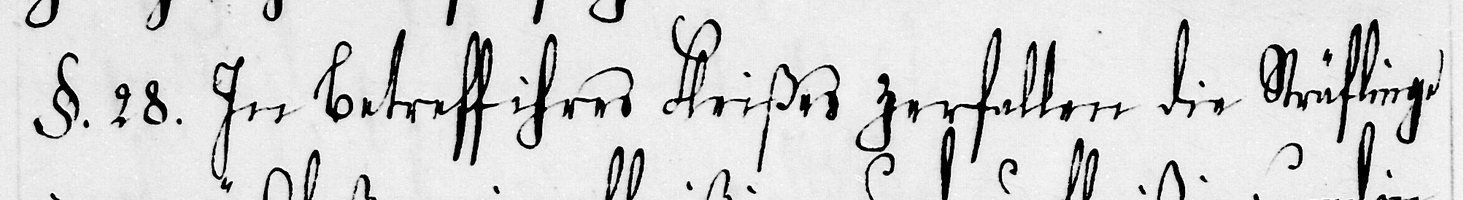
§. 28. In Betreff ihres Fleißes zerfallen die Sträflinge
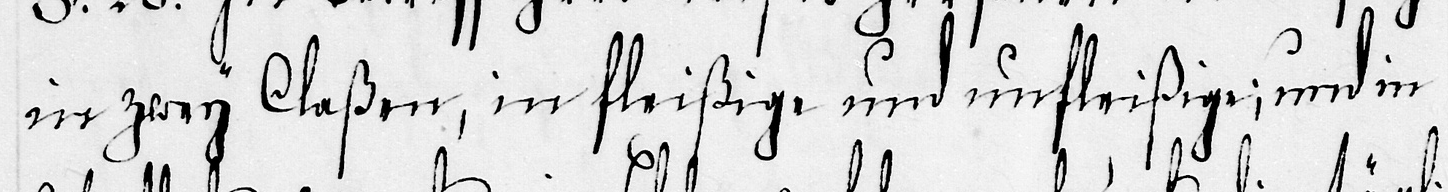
in zwey Claßen, in fleißige und unfleißige; und in
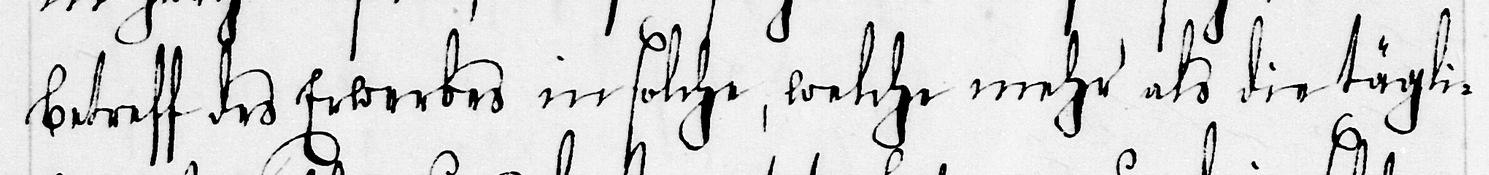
Betreff des Erwerbes in solche, welche mehr als die tägli¬
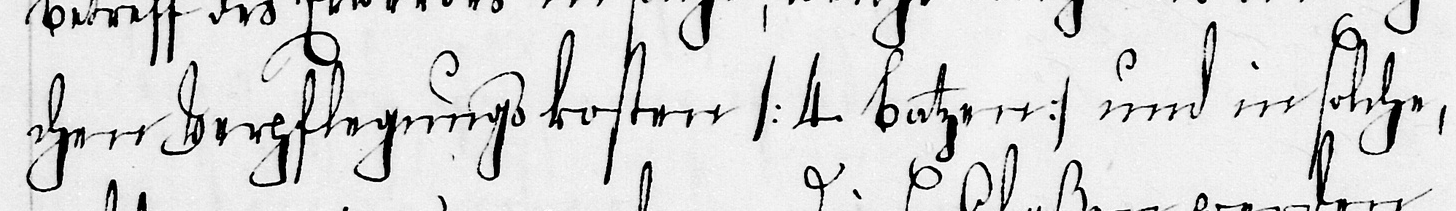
chen Verpflegungskosten [4 Batzen] und in solche,
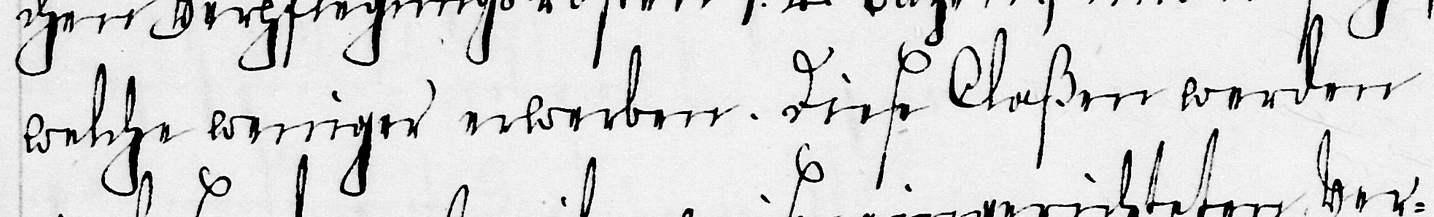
welche weniger erwerben. Diese Claßen werden
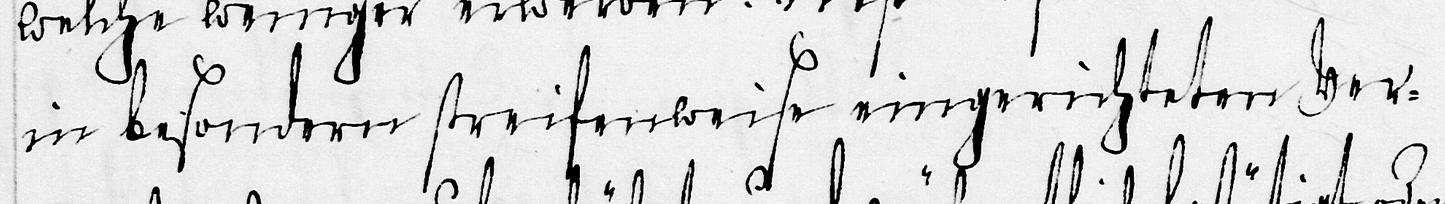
in besondern streifenweise eingerichteten Ver¬
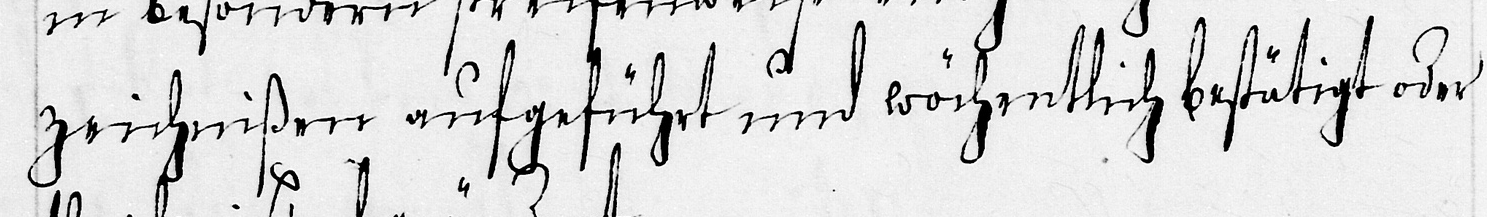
zeichnißen aufgeführt und wöchentlich bestätigt oder
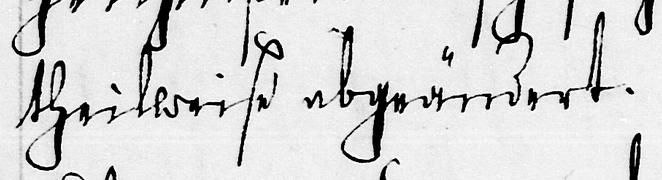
theilweise abgeändert.
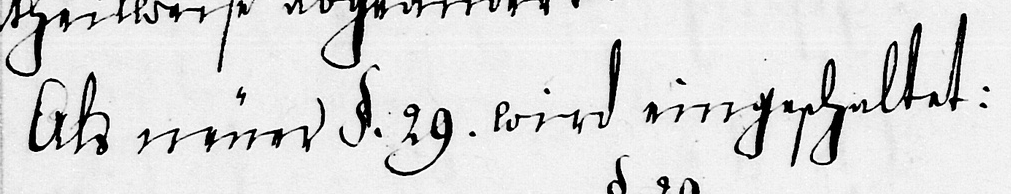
Als neuer §. 29. wird eingeschaltet:
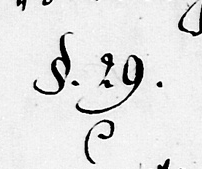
§. 29.
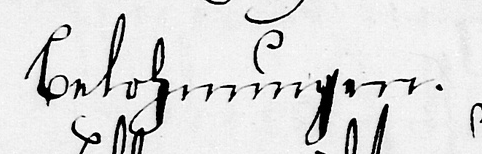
Belohnungen.
